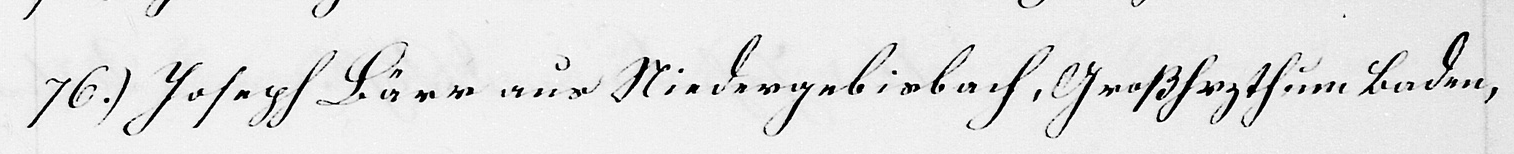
76.) Joseph Bärr aus Niedergebisbach, Großhrzthum Baden,
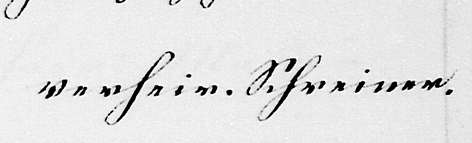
verheir. Schreiner.
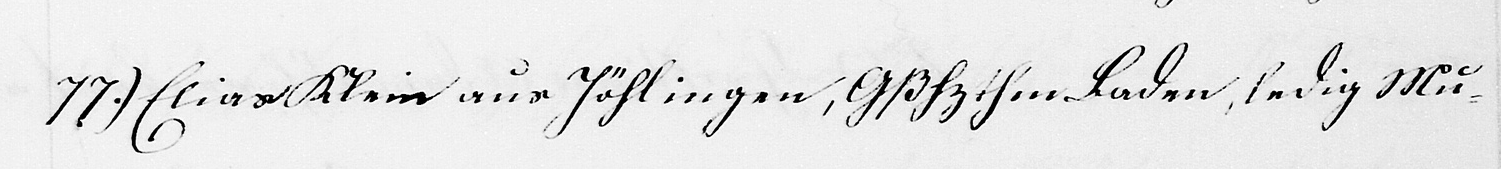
77.) Elias Klein aus Jöhlingen, Gßhzthm Baden, ledig Mu¬
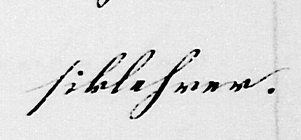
siklehrer.
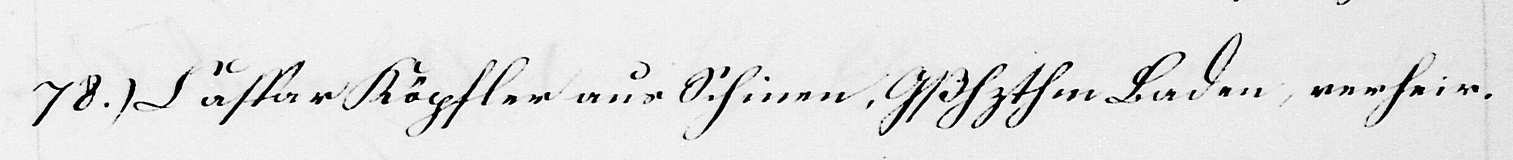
78.) Caspar Köpfler aus Schinen, Gßhzthm Baden, verheir.
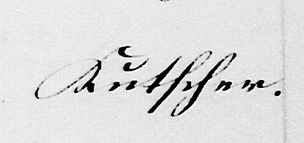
Kutscher.
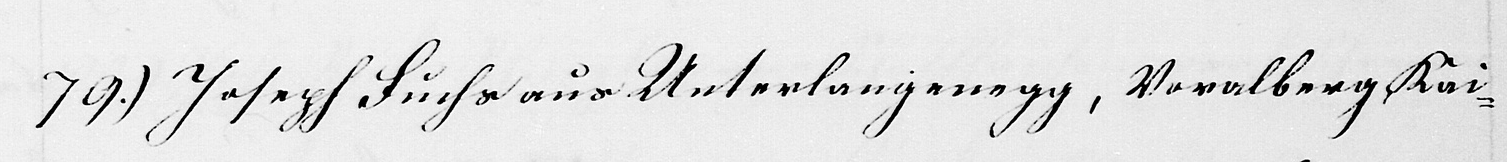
79.) Joseph Fuchs aus Unterlangenegg, Voralberg, Kai¬
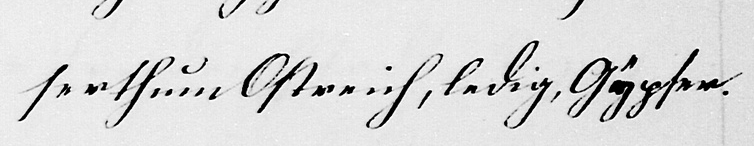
serthum Ostreich, ledig, Gypser.
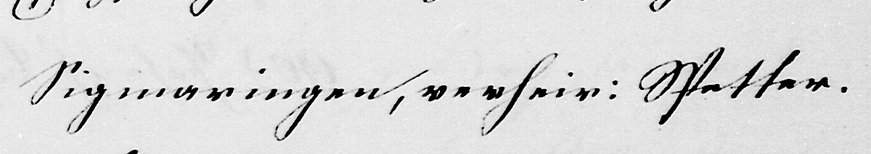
igmaringen, verheir: Spetter.
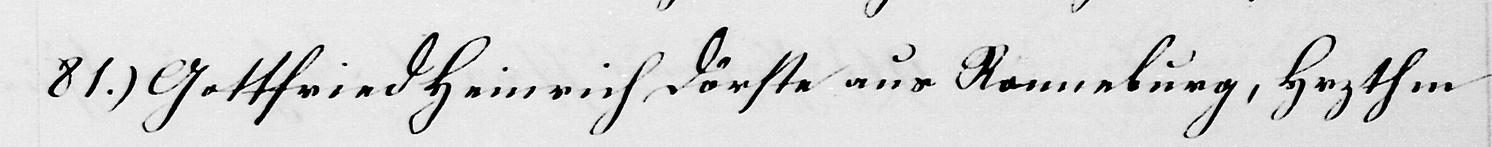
81.) Gottfried Heinrich Dörste aus Ronneburg, Hrzthm
